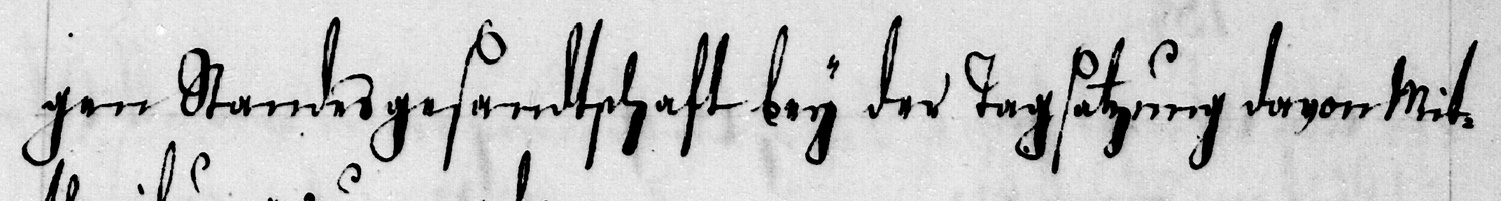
gen Standesgesandtschaft bey der Tagsatzung davon Mit¬
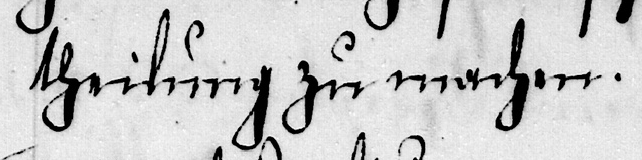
theilung zu machen.
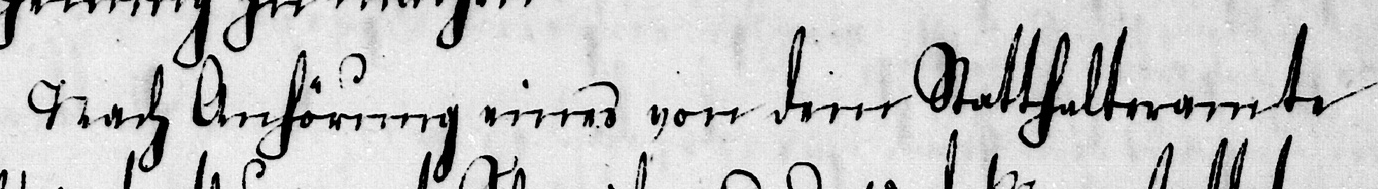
Nach Anhörung eines von dem Statthalteramte
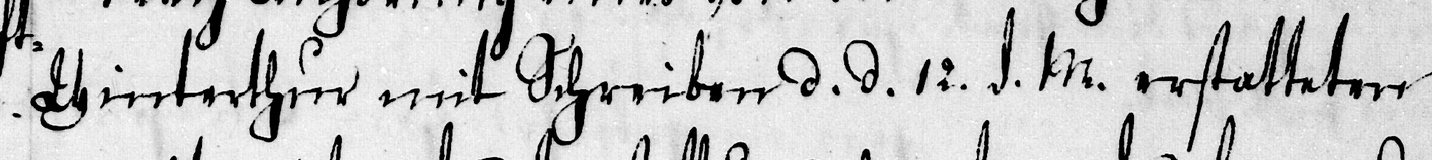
Winterthur mit Schreiben d. d. 12. d. M. erstatteten
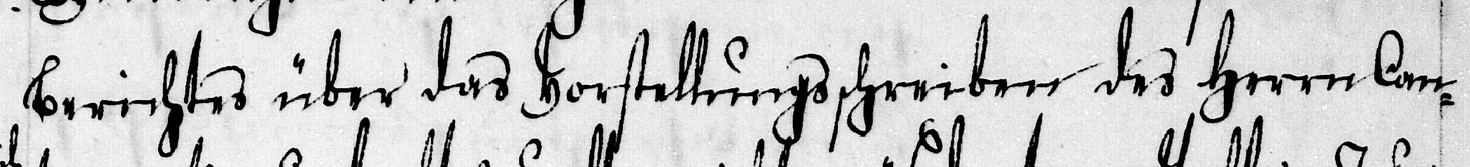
Berichtes über das Vorstellungsschreiben des Herrn Can¬
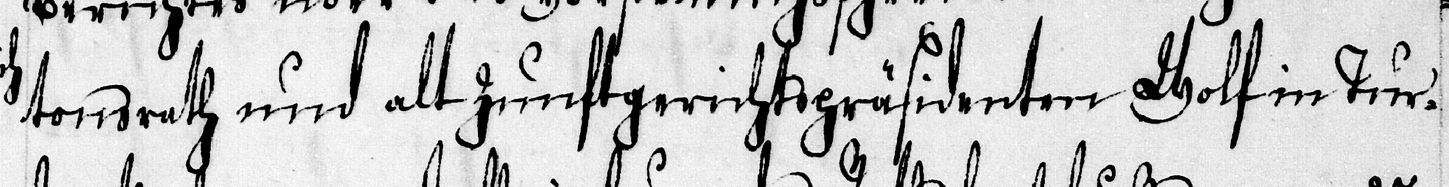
tonsrath und alt Zunftgerichtspräsidenten Wolf in Tur¬
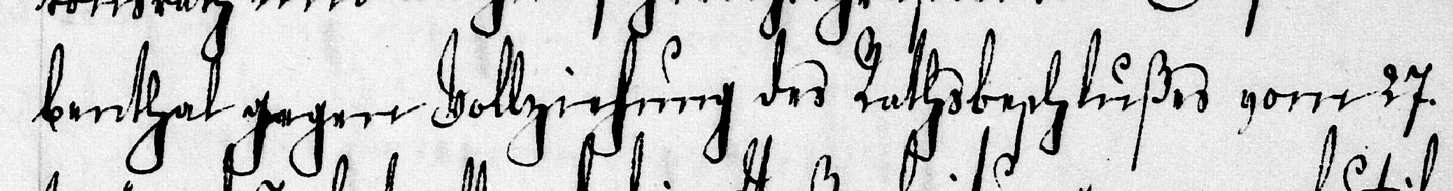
benthal gegen Vollziehung des Rathsbeschlußes vom 27.
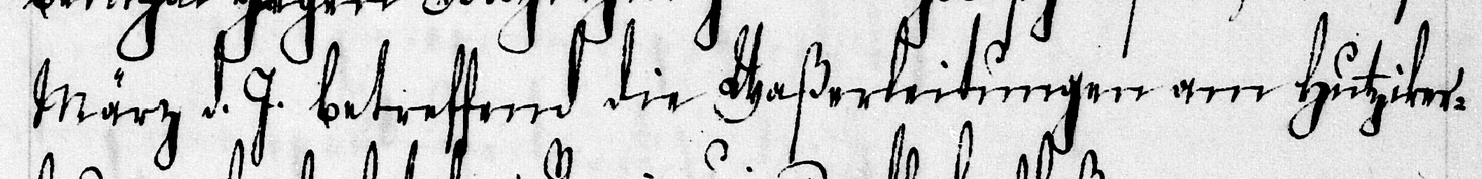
März d. J. betreffend die Waßerleitungen am Hutzike¬
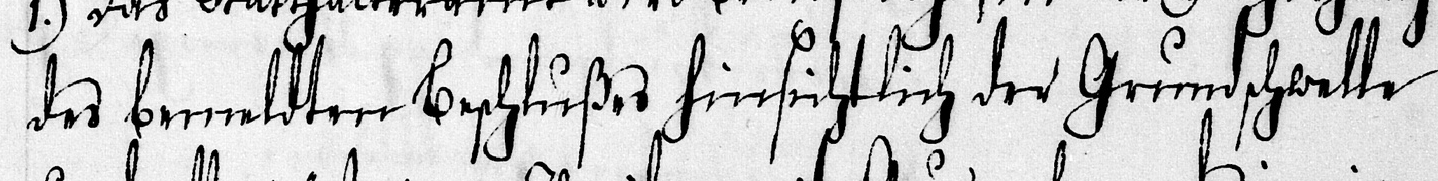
des bemeldten Beschlußes hinsichtlich der Grundschwelle
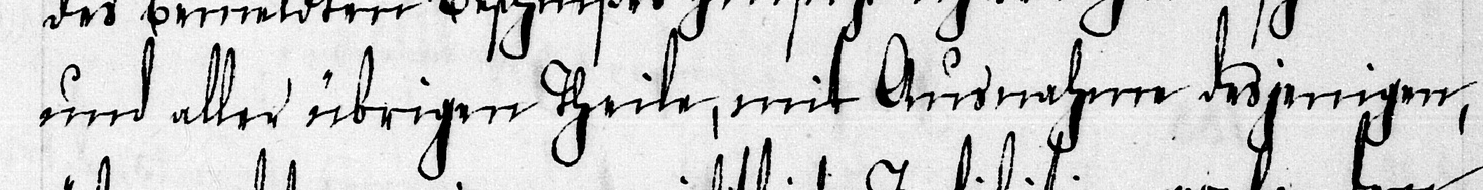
und aller übrigen Theile, mit Ausnahme desjenigen,
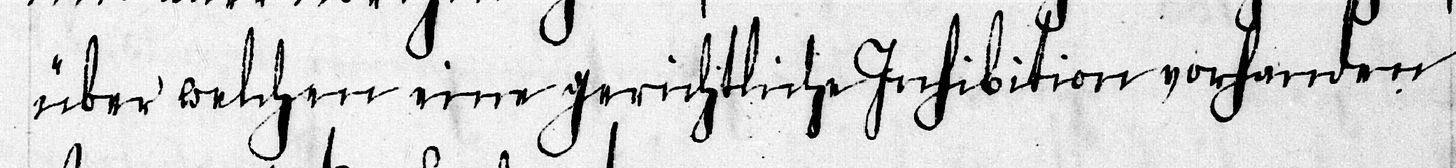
über welchen eine gerichtliche Inhibition vorhanden
